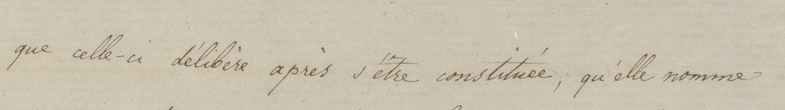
que celle-ci délibère après s'être constituée, qu'elle nomme
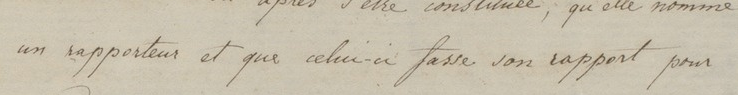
un rapporteur et que celui-ci fasse son rapport pour
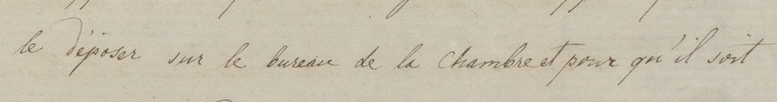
le déposer sur le bureau de la chambre et pour qu'il soit
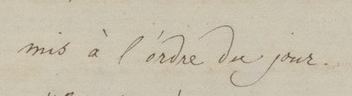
mis à l'ordre du jour.
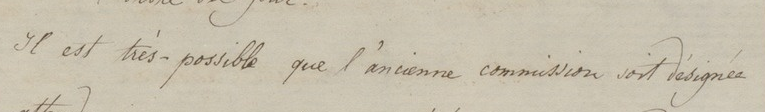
Il est très-possible que l'ancienne commission soit désignée
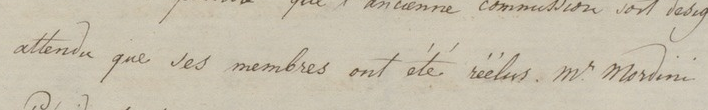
attendu que ses membres ont été réélus. MrMordini
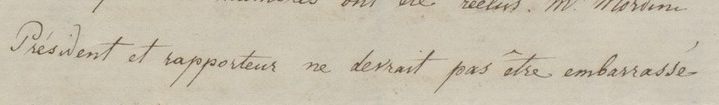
Président et rapporteur ne devrait pas être embarrassé
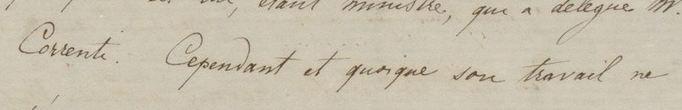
Correnti. Cependant et quoique son travail ne
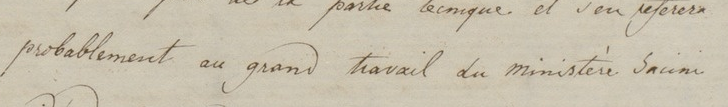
probablement au grand travail du ministère Jacini
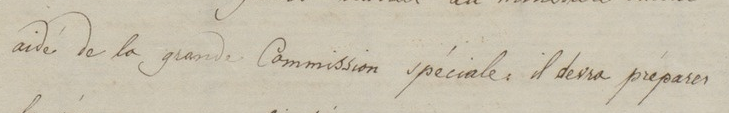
aidé de la grande Commission spéciale: il devra préparer
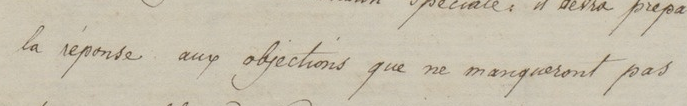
la réponse aux objections que ne manqueront pas
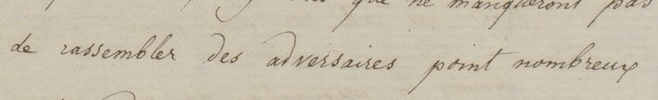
de rassembler des adversaires point nombreux
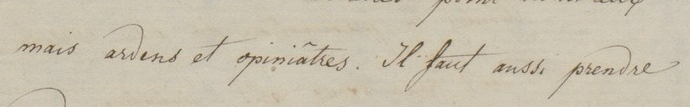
mais ardens et opiniâtres. Il faut aussi prendre
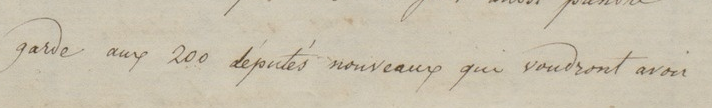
garde aux 200 députés nouveaux qui voudront avoir
